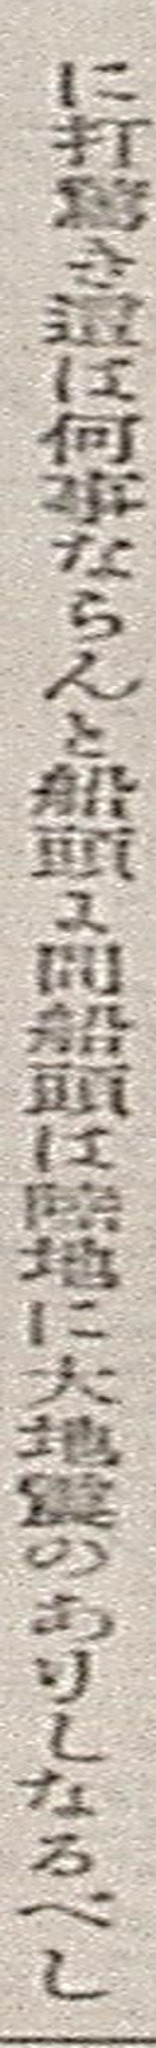に打驚き這は何事ならんと船頭に問船頭は陸地に大地震のありしなるべし
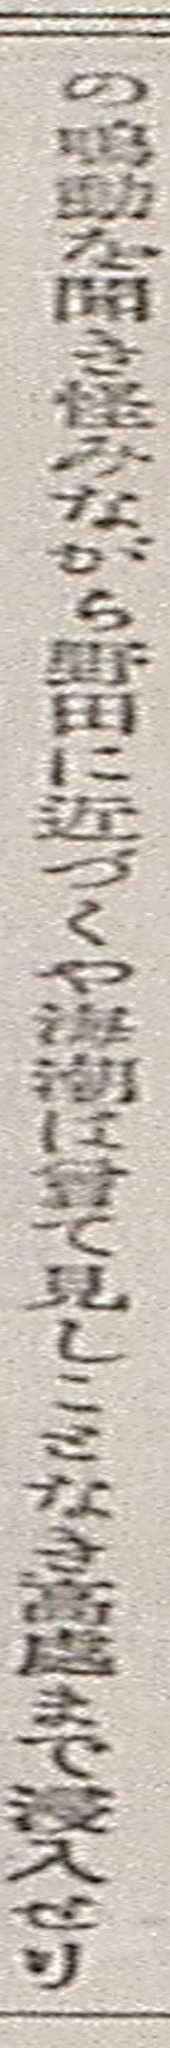の鳴動を聞き怪みながら野田に近づくや海潮は曾て見しことなき高処まで浸入せり
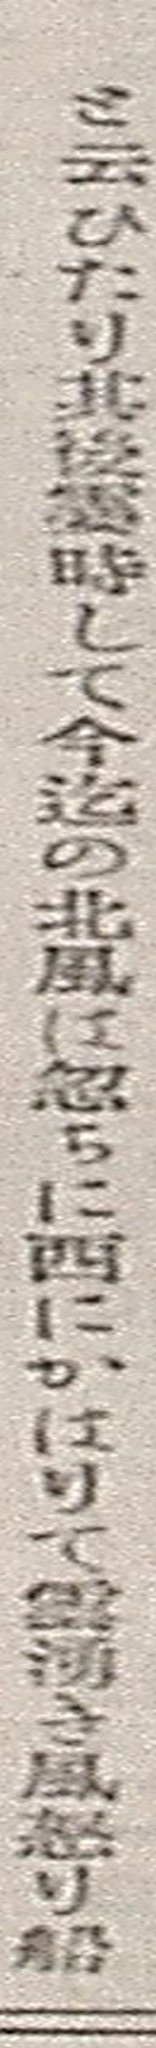と云ひたり其後霎時して今迄の北風は忽ちに西にかはりて雲湧き風怒り船
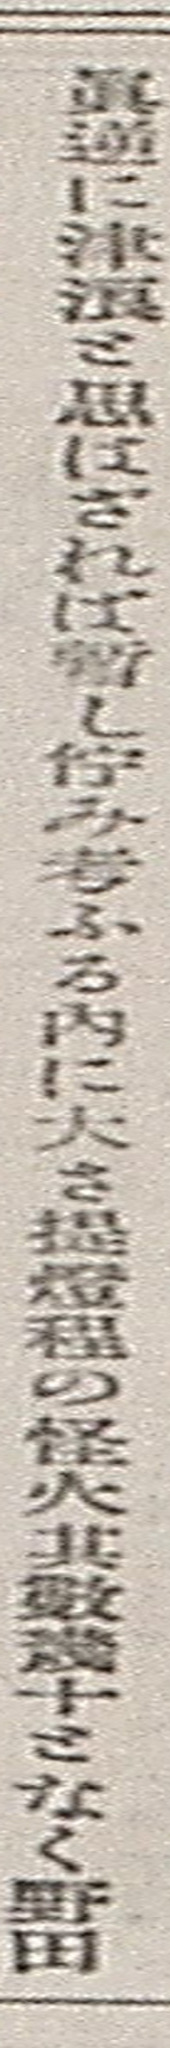真逆に津浪と思はざれば暫し佇み考ふる内に大さ提燈程の怪火其数幾十となく野田
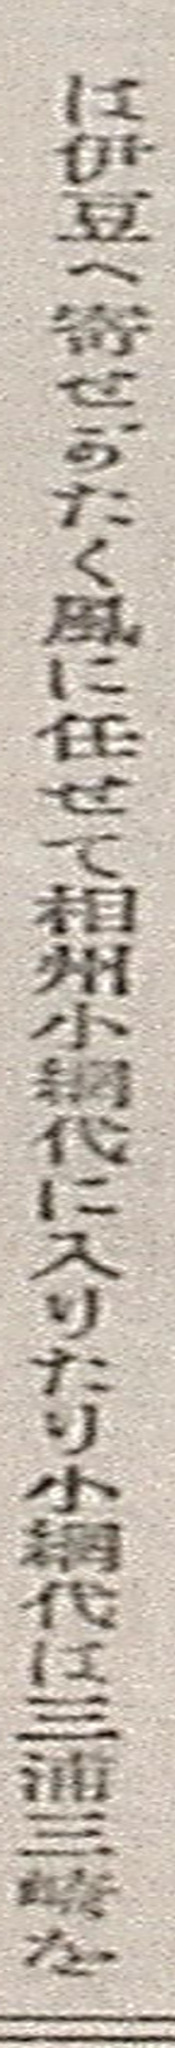は伊豆へ寄せがたく風に任せて相州小網代に入りたり小網代は三浦三崎を
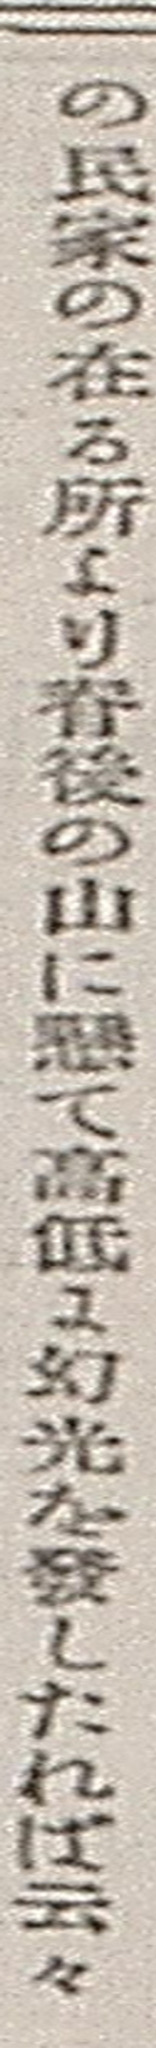の民家の在る所より脊後の山に懸て高低に幻光を発したれば云々
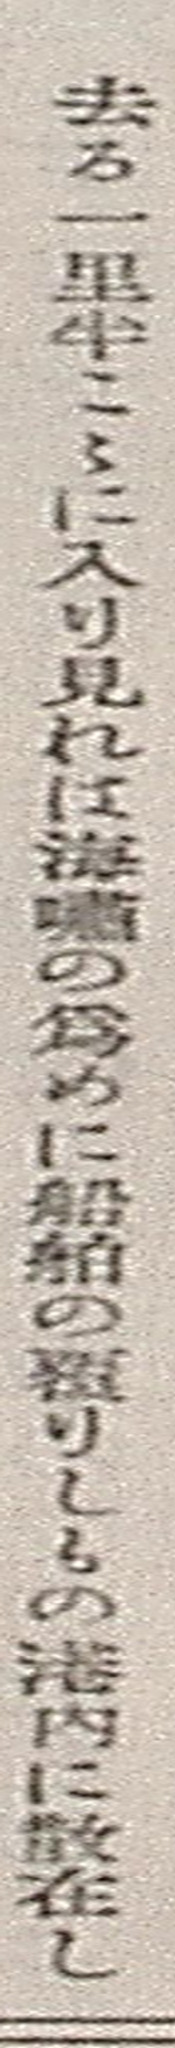去る一里半こゝに入り見れば海嘯の為めに船舶の覆りしもの港内に散在し
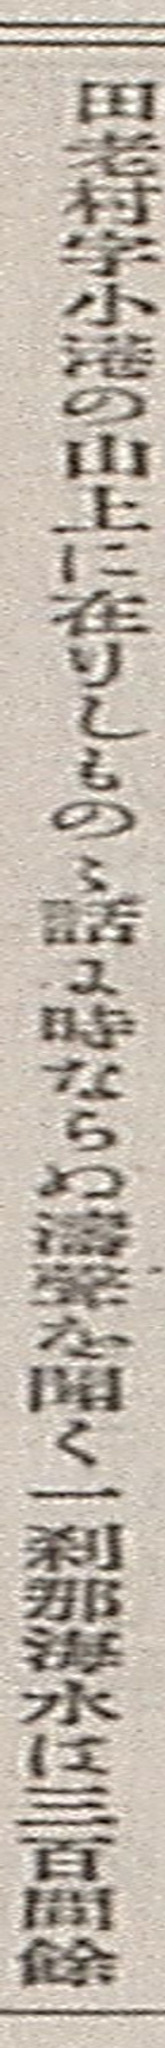田老村字小港の山上に在りしものゝ話に時ならぬ濤声を聞く一刹那海水は三百間余
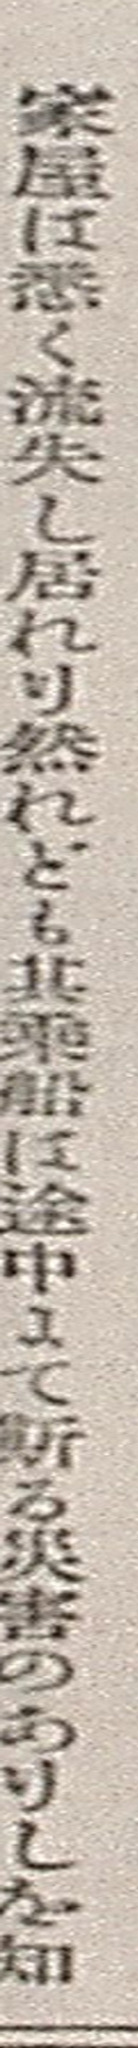家屋は悉く流失し居れり然れども其乗船は途中にて斯る災害のありしを知
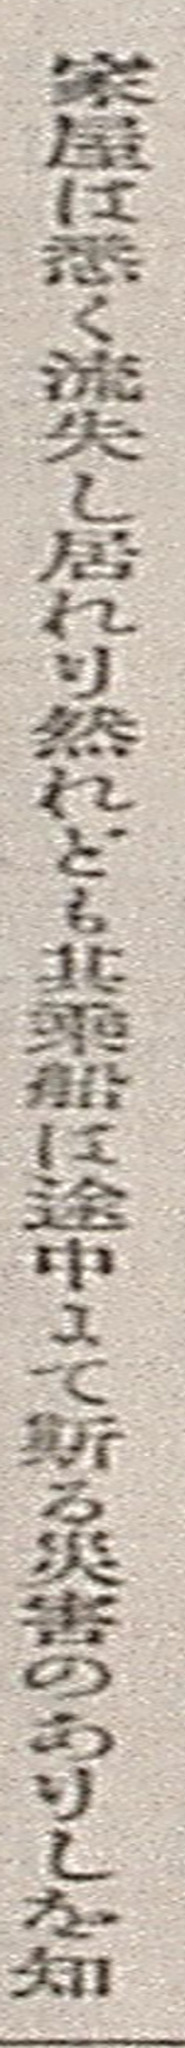家屋は悉く流失し居れり然れども其乗船は途中にて斯る災害のありしを知
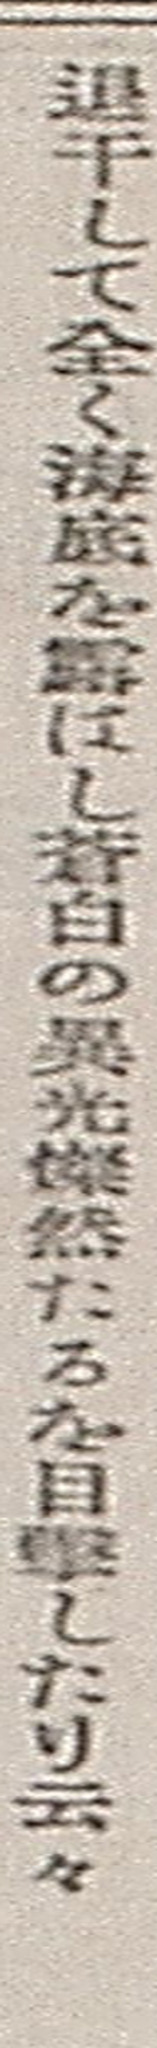退干して全く海底を露はし蒼白の異光燦然たるを目撃したり云々
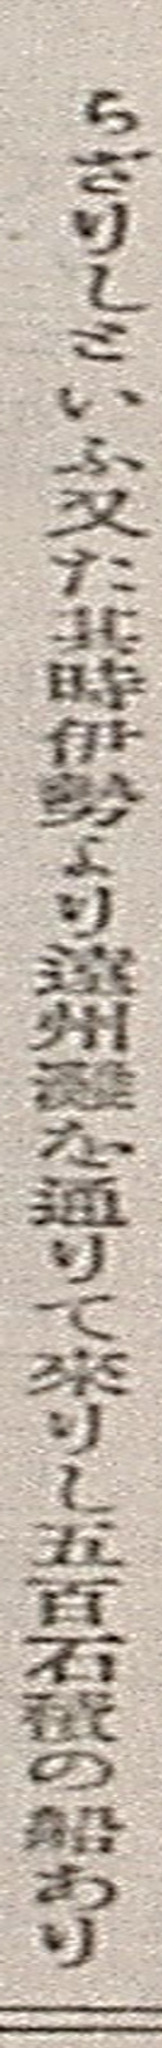らざりしといふ又た其時伊勢より遠州灘を通りて来りし五百石積の船あり
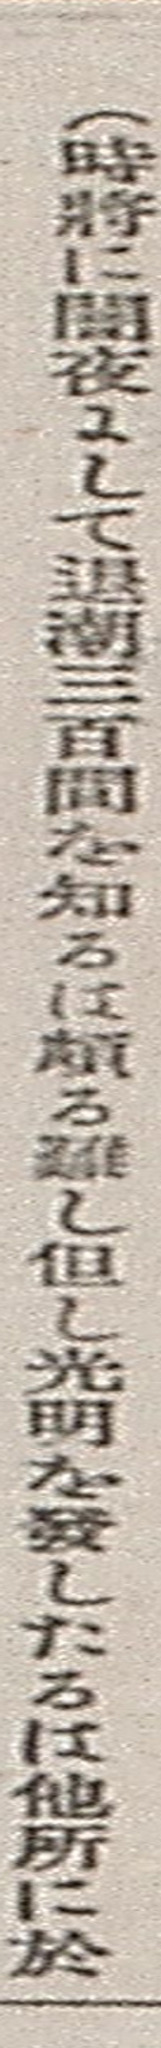（時将に闇夜にして退潮三百間を知るは頗る難し但し光明を発したるは他所に於
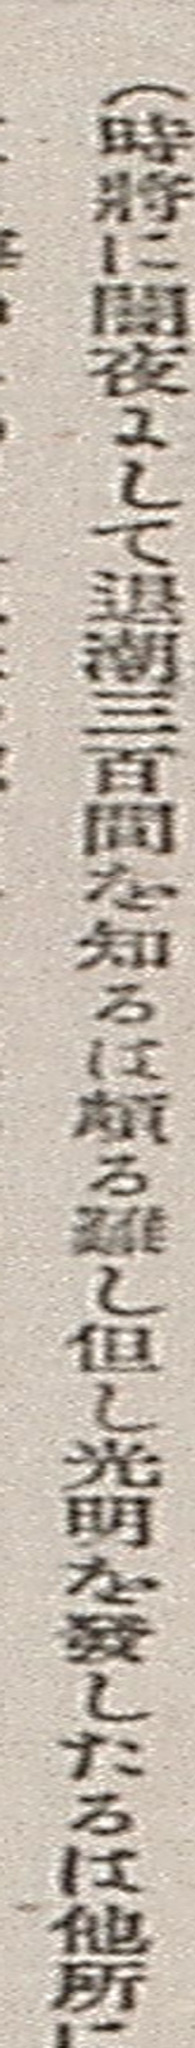（時将に闇夜にして退潮三百間を知るは頗る難し但し光明を発したるは他所に於
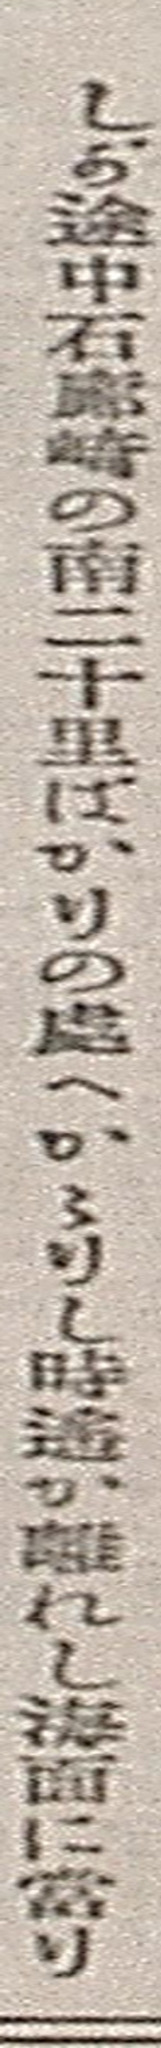しが途中石廊崎の南二十里ばかりの処へかゝりし時遙か離れし海面に当り
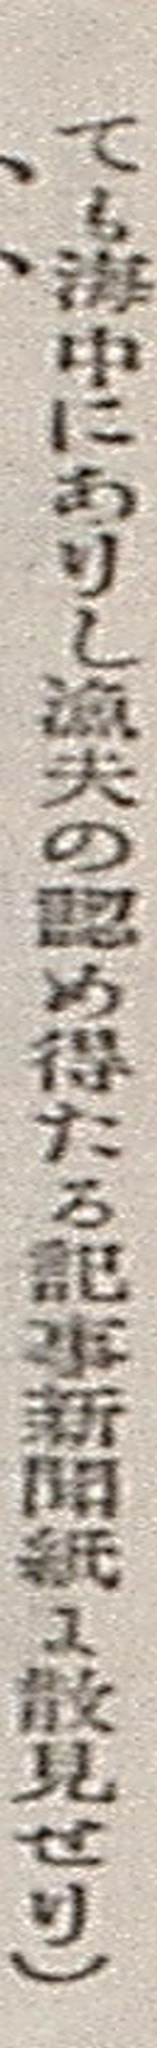ても海中にありし漁夫の認め得たる記事新聞紙に散見せり）
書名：風俗畫報臨時増刊第百十九號　大海嘯被害録（中）
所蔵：東京大学地震研究所図書室 Earthquake Research Institute Library, The University of Tokyo, JAPAN
